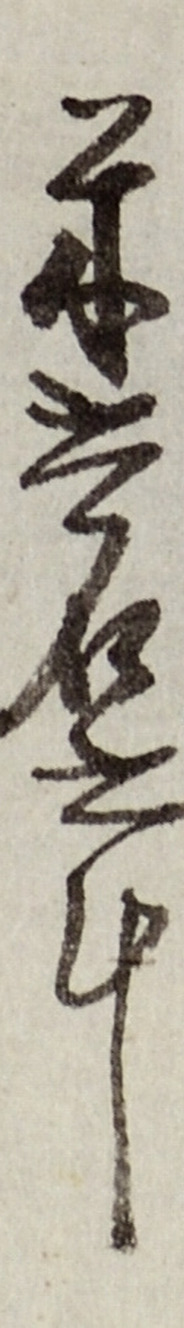米六石六斗
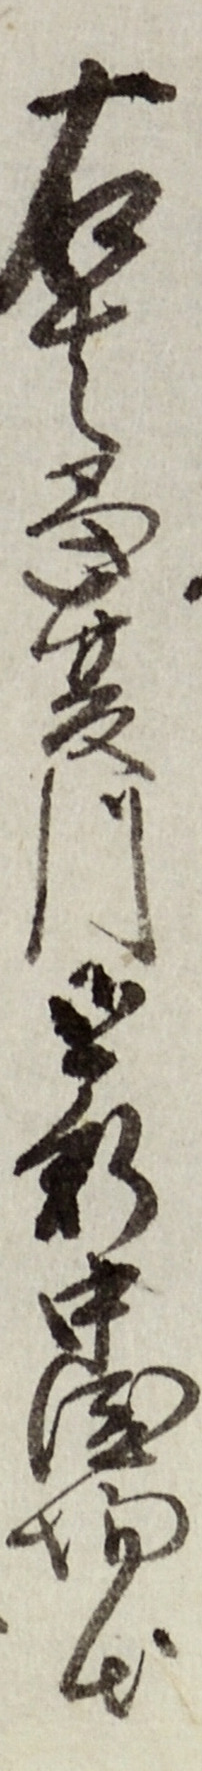右者当夏川御薪中渡場出
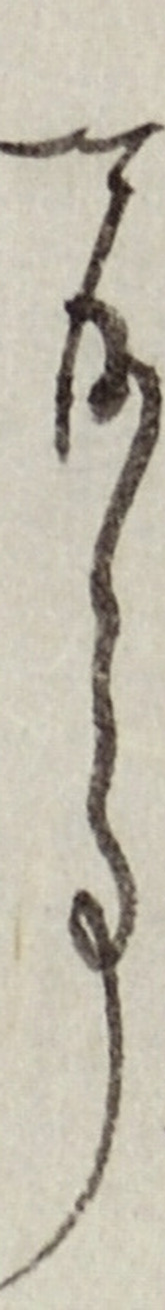奉存候事
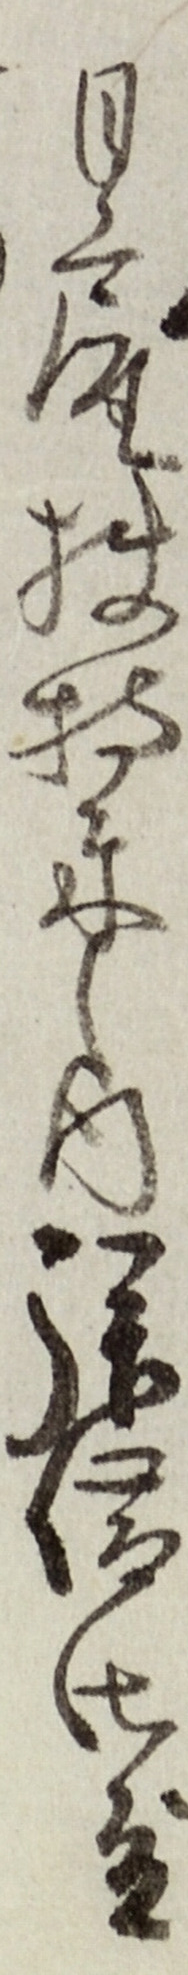日雇扶持米之内拝借仕度
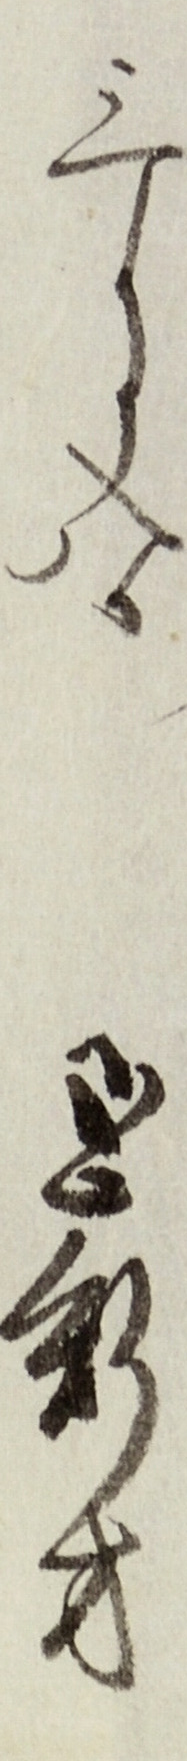三月八日御薪方
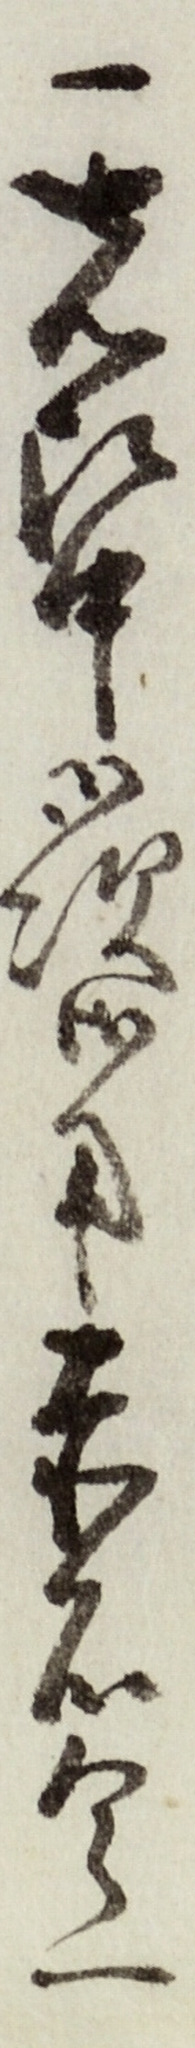一先頃中御次御用赤石今一

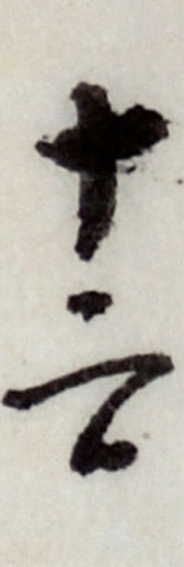十三日
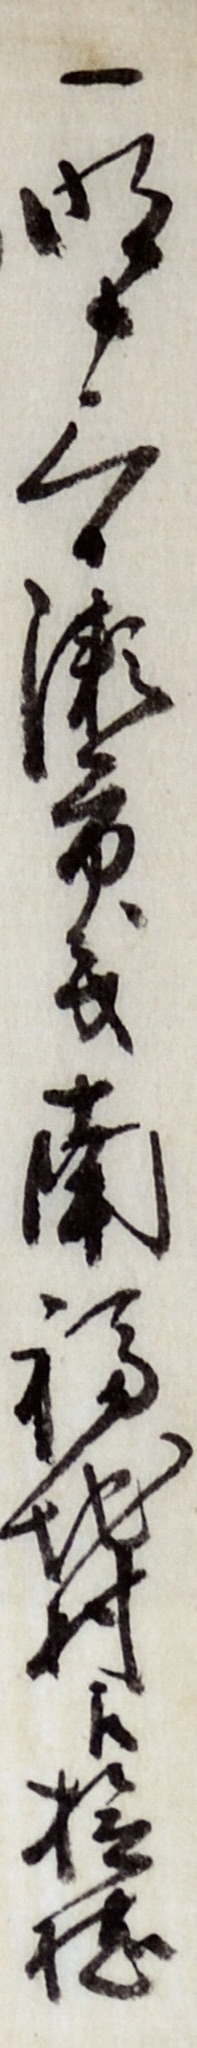一明十三日瀬市義南福地村江桧椹
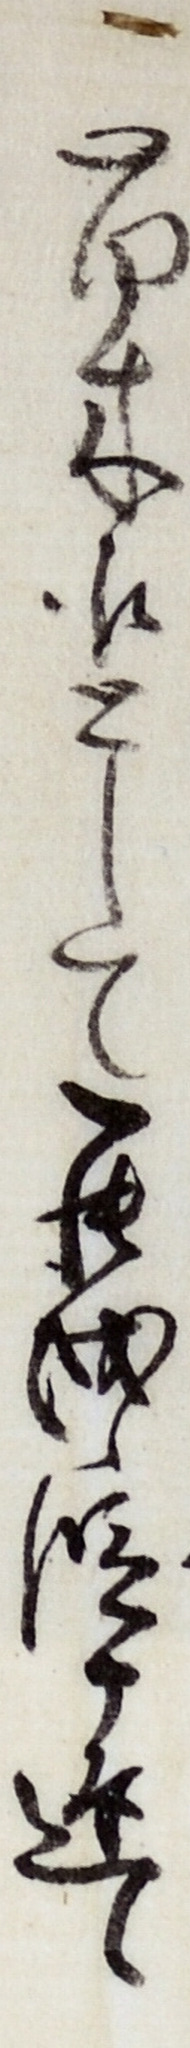苗木取として罷越候段申達候
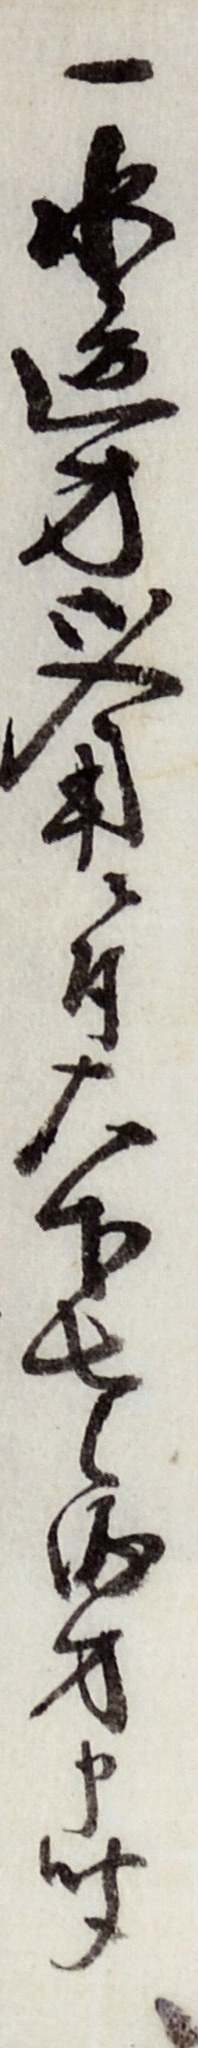一水道方御入用ニ付大下七兵衛方申聞
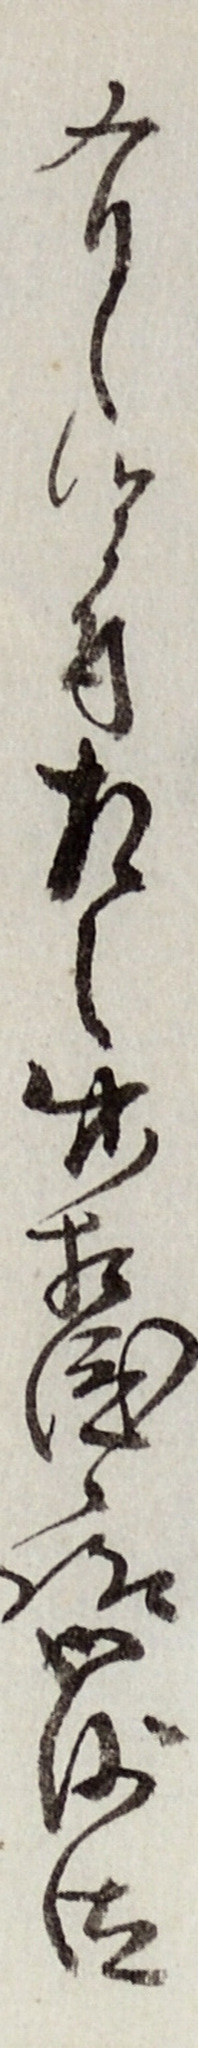有之候ニ付左之竹相渡候様御沙汰
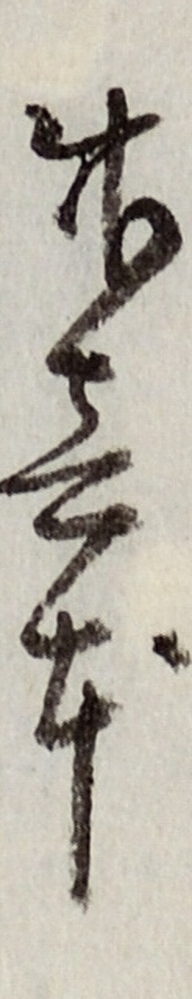竹壱本
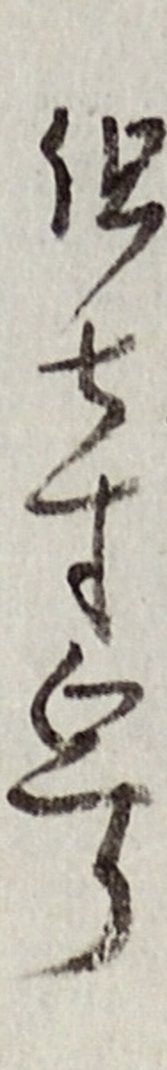但七寸廻り
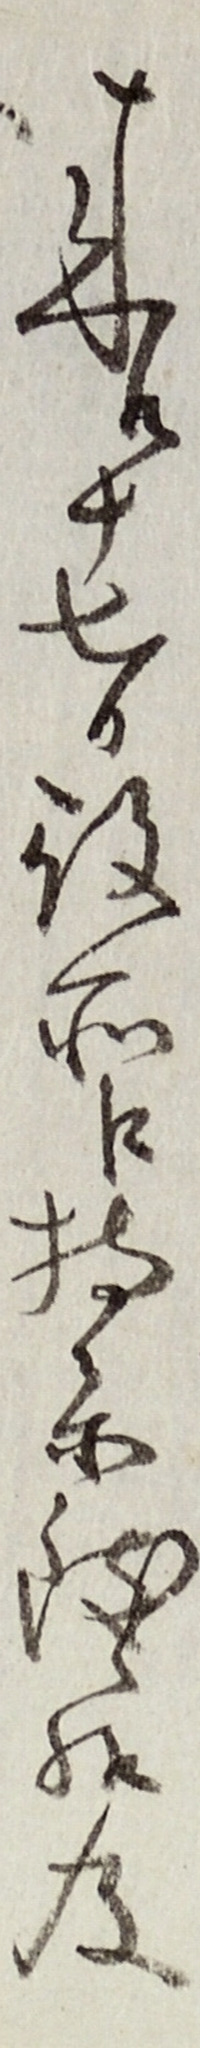来ル十七日役所江持参致候様及
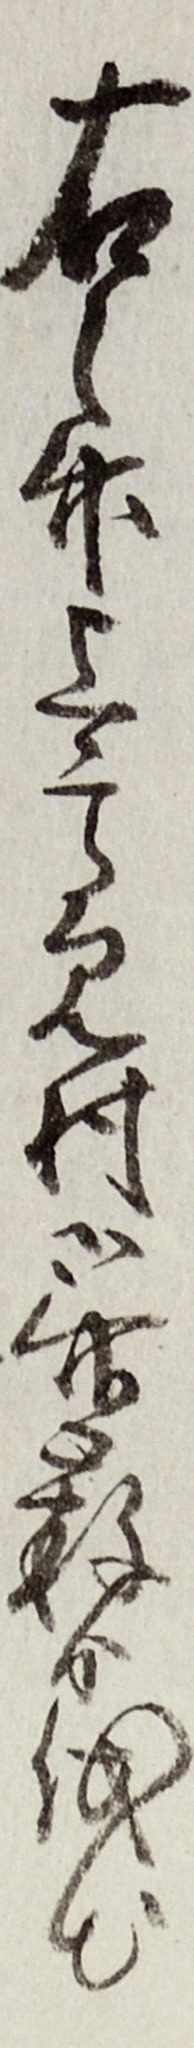右之竹上高見村御竹薮ゟ伐出
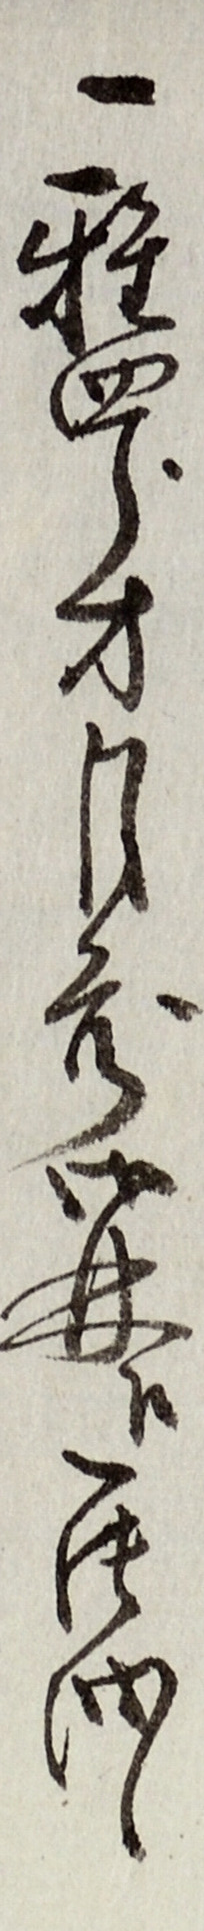一雅四郎方月蔵御林江罷越候
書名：御山方御薪方諸事御用留
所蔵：伊那市立高遠町図書館・合同会社AMANE
